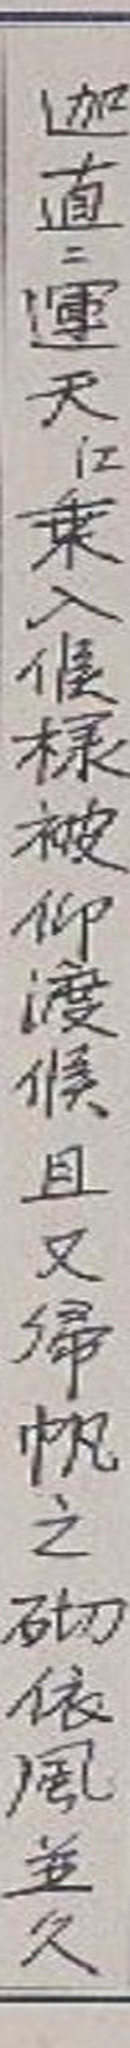迦直に運天え乗入候様被仰渡候且又帰帆之砌依風並久
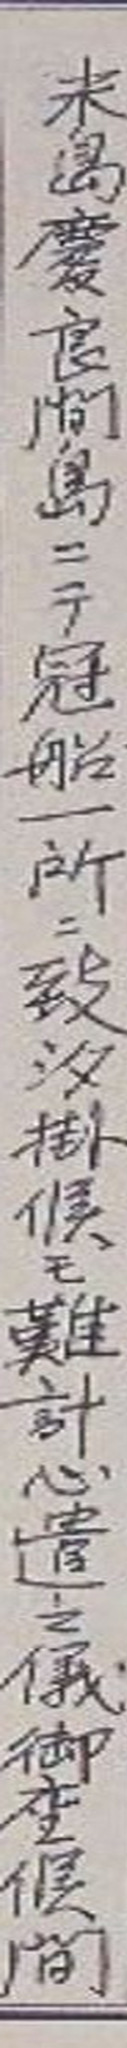米島慶良間島にて冠船一所に致汐掛候も難計心遣之儀御座候間
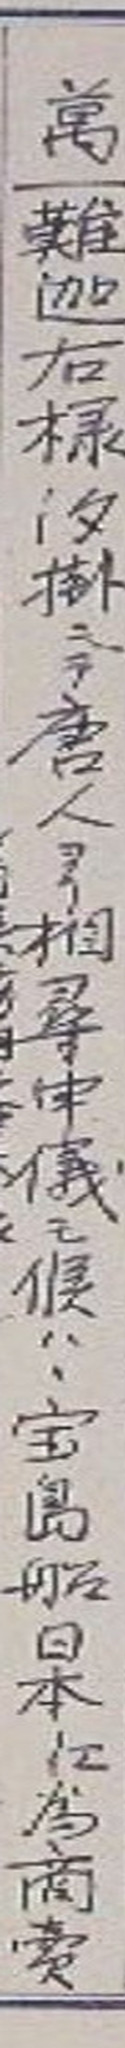万一難迦右様汐掛にて唐人より相尋申儀も候はゝ宝島船日本え為商売
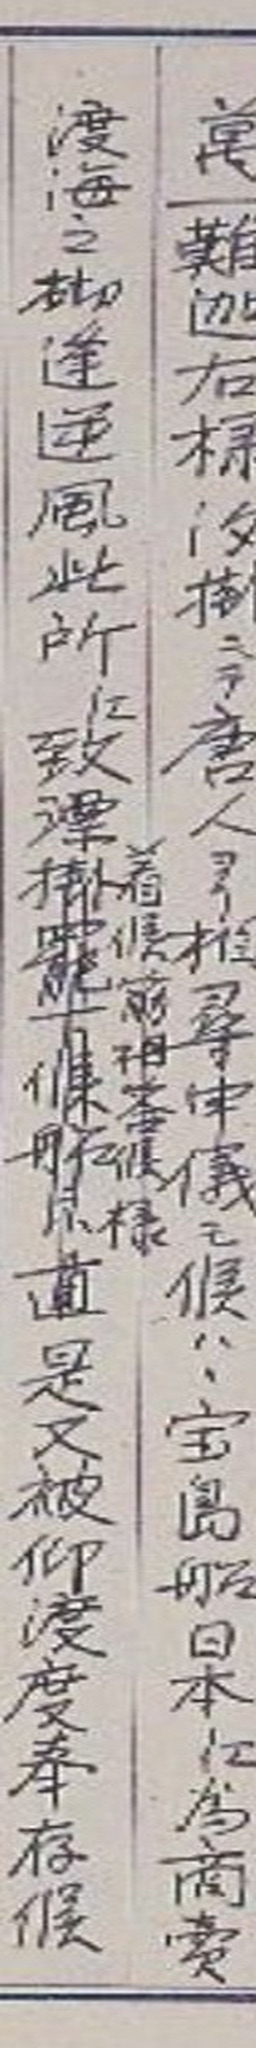渡海之砌逢逆風此所え致漂着候筋相答候様是又被仰渡度奉存候
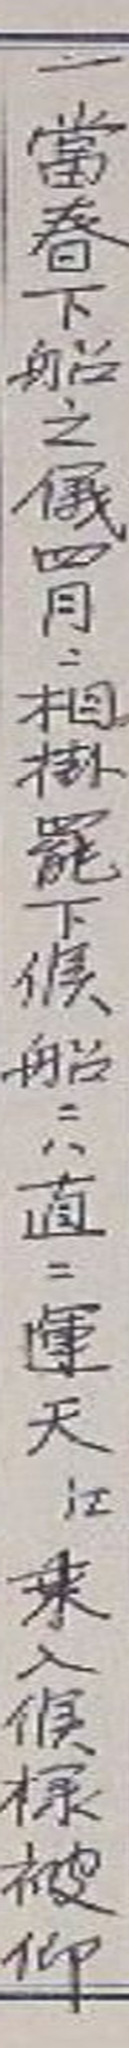一当春下船之儀四月に相掛罷下候船には直に運天え乗入候様被仰
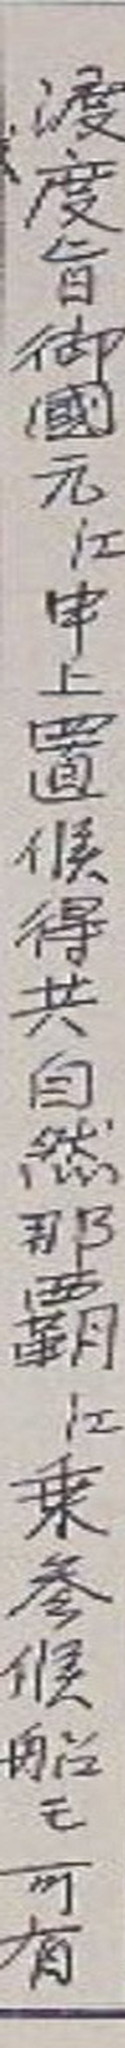渡度旨御国元え申上置候得共自然那覇え乗参候船も可有
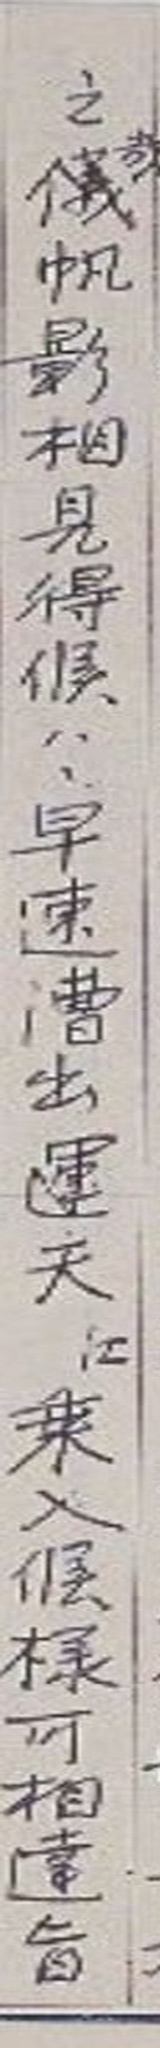之哉帆影相見得候はゝ早速漕出運天え乗入候様可相達旨
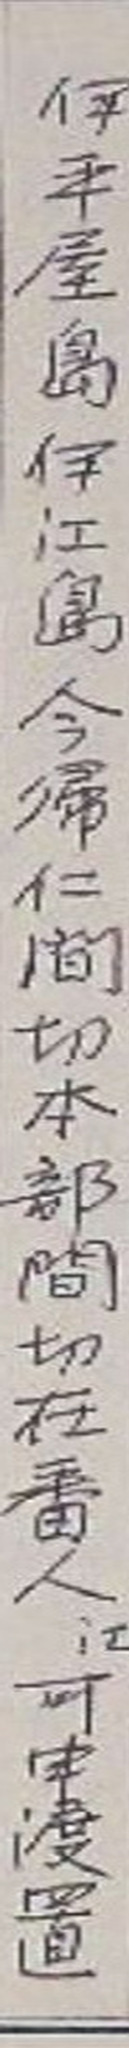伊平屋島伊江島今帰仁間切本部間切在番人え可申渡置
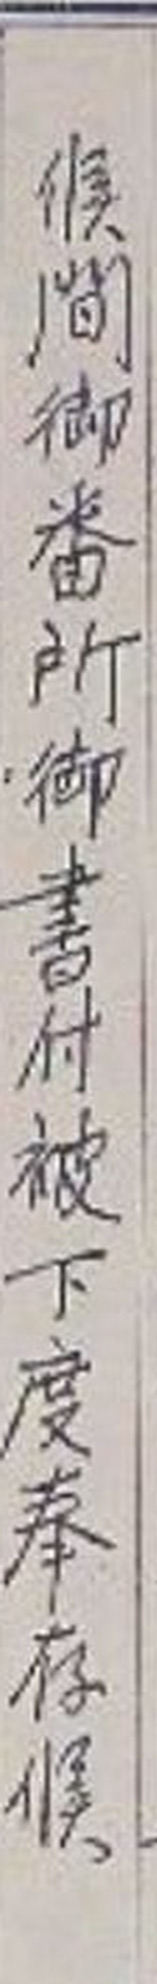候間御番所御書付被下度奉存候
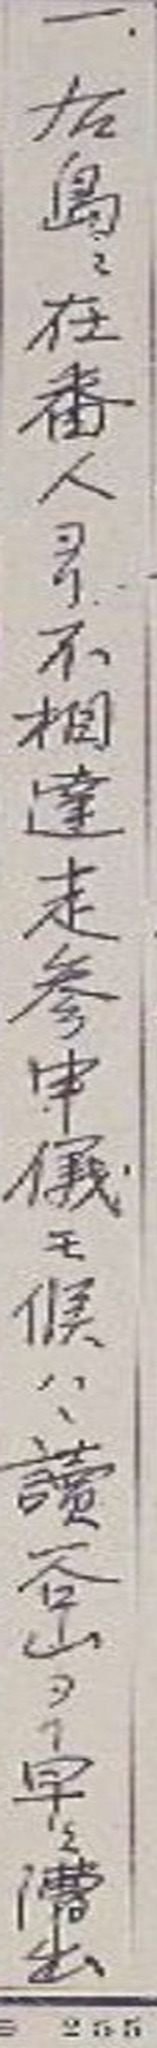一右島々在番人より不相達走参申儀も候はゝ読谷山より早々漕出
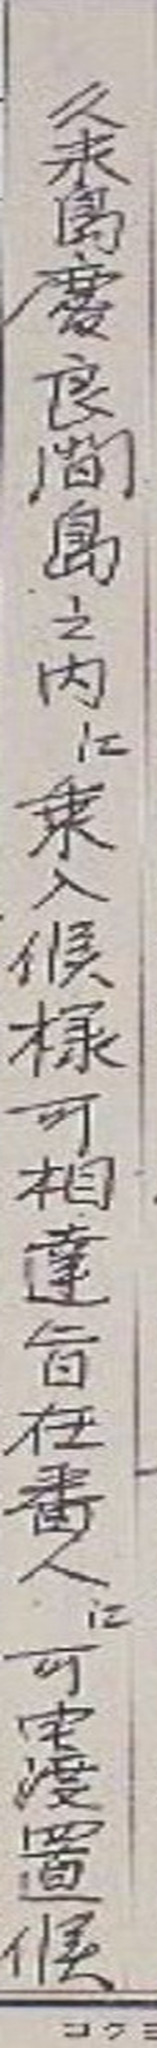久米島慶良間島之内え乗入候様可相達旨在番人え可申渡置候
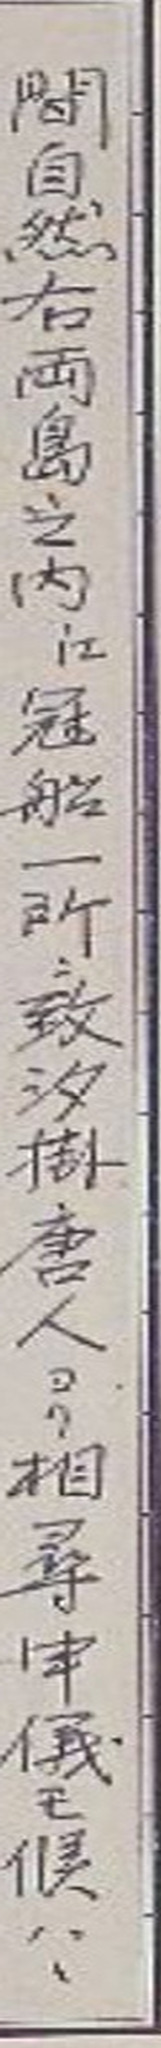間自然右両島之内え冠船一所に致汐掛唐人より相尋申儀も候はゝ
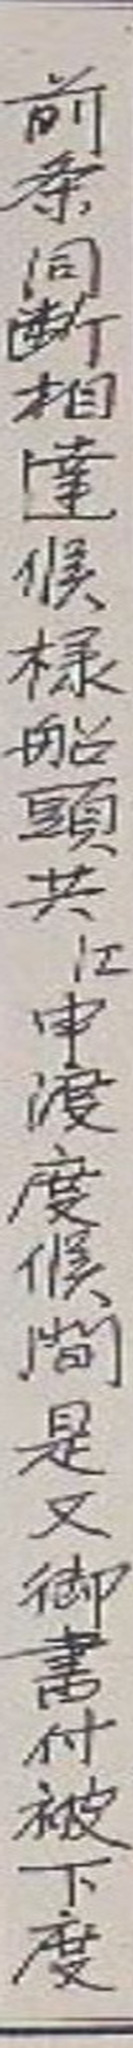前条同断相達候様船頭共え申渡度候間是又御書付被下度
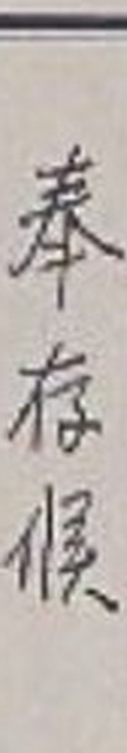奉存候
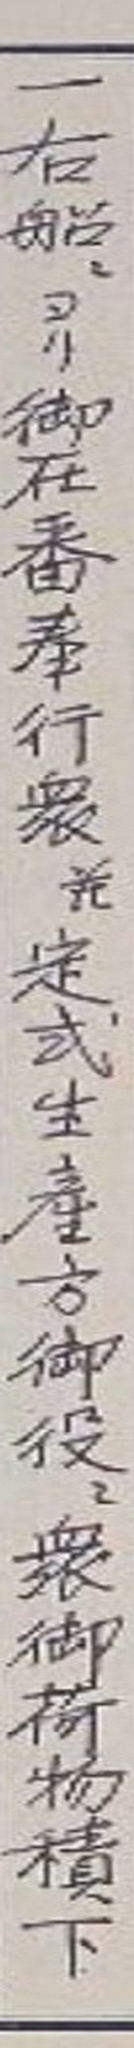一右船々より御在番奉行衆并定式生産方御役々衆御荷物積下
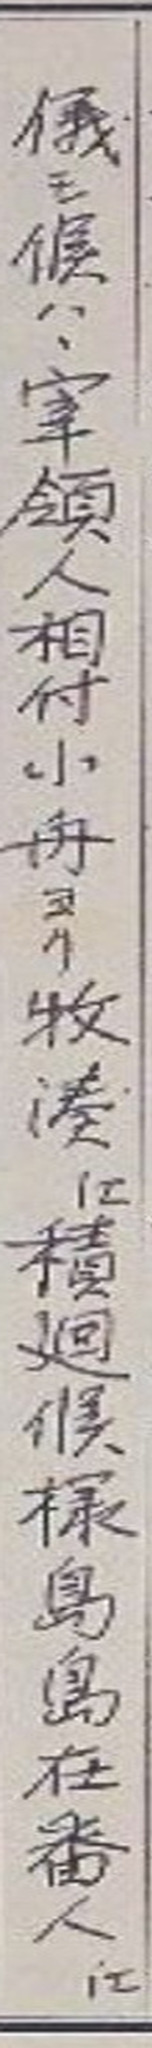儀も候はゝ宰領人相付小舟より牧湊え積廻候様島島在番人え
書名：支那冊封使来琉諸記 下巻
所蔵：University of the Ryukyus Library
